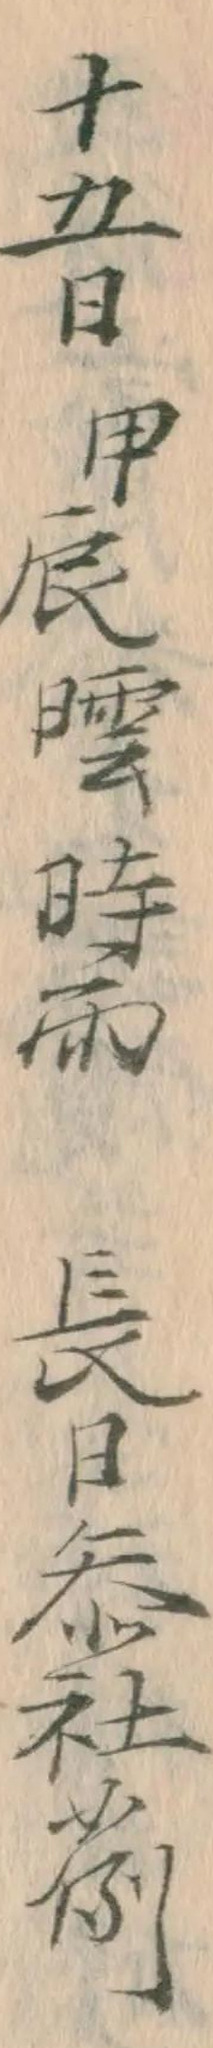十五日甲辰曇時雨長日参社如例
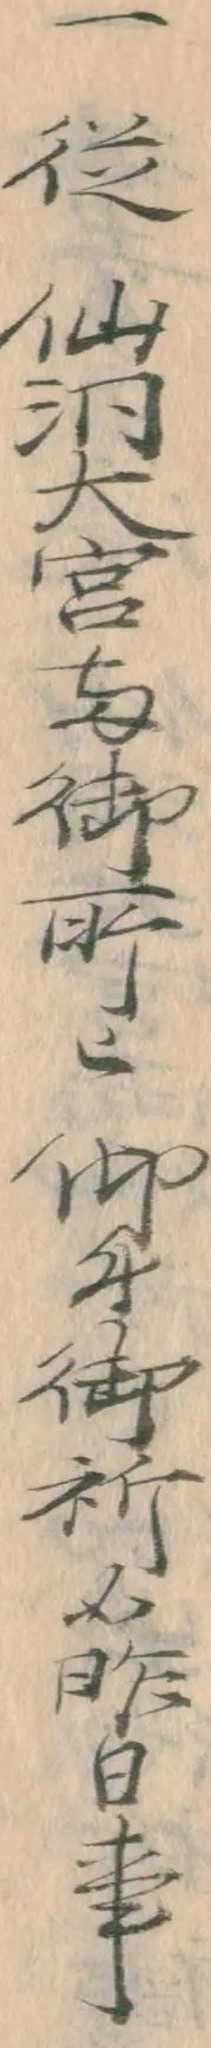一従仙洞大宮両御所被仰付御祈如昨日事
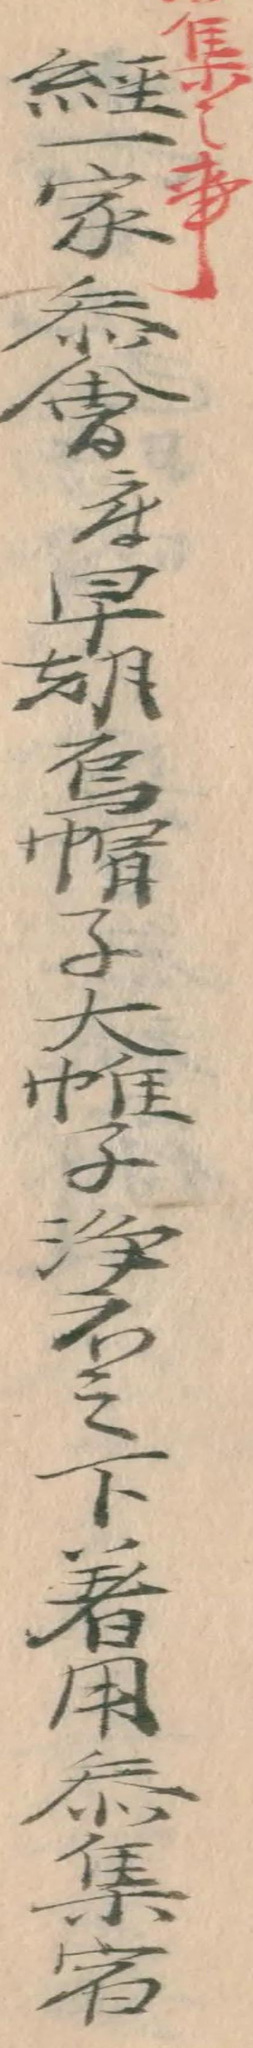一経一家参會ニ付早朝烏帽子大帷子浄衣之下着用参集宿
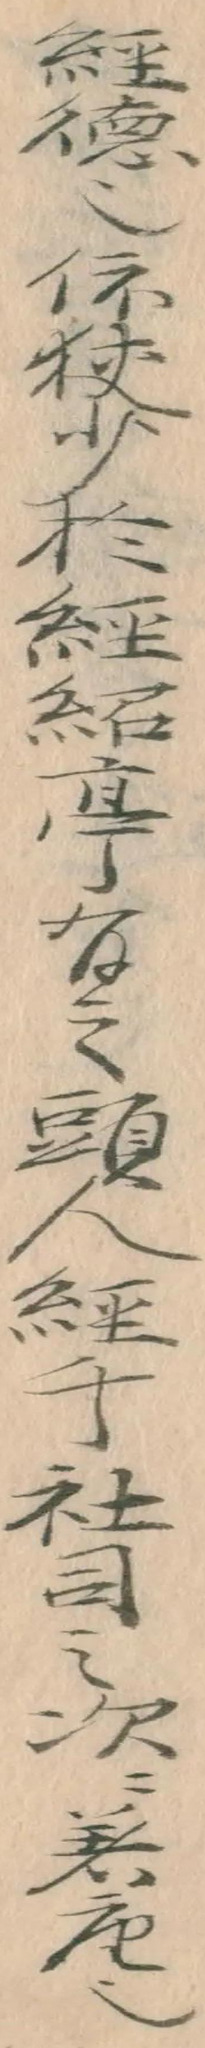経徳也依狭少於経紹亭有之頭人経千社司之次ニ着座也
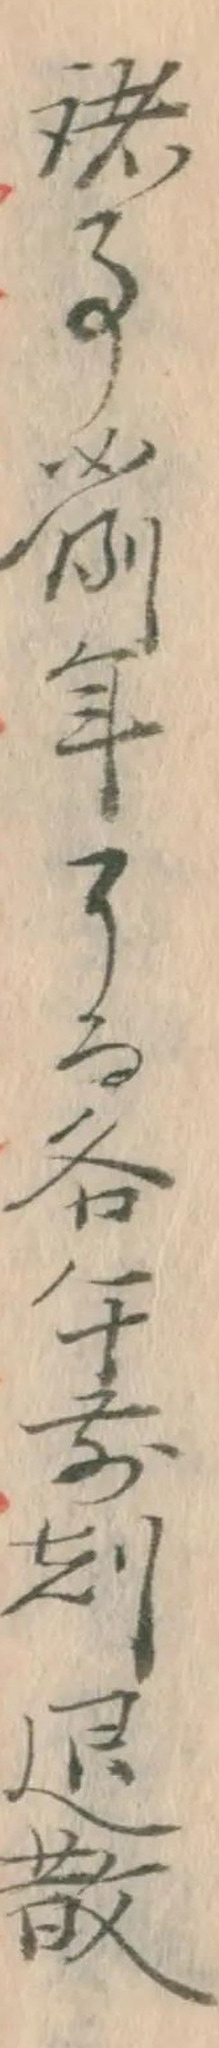諸事如例年了而各午前刻退散
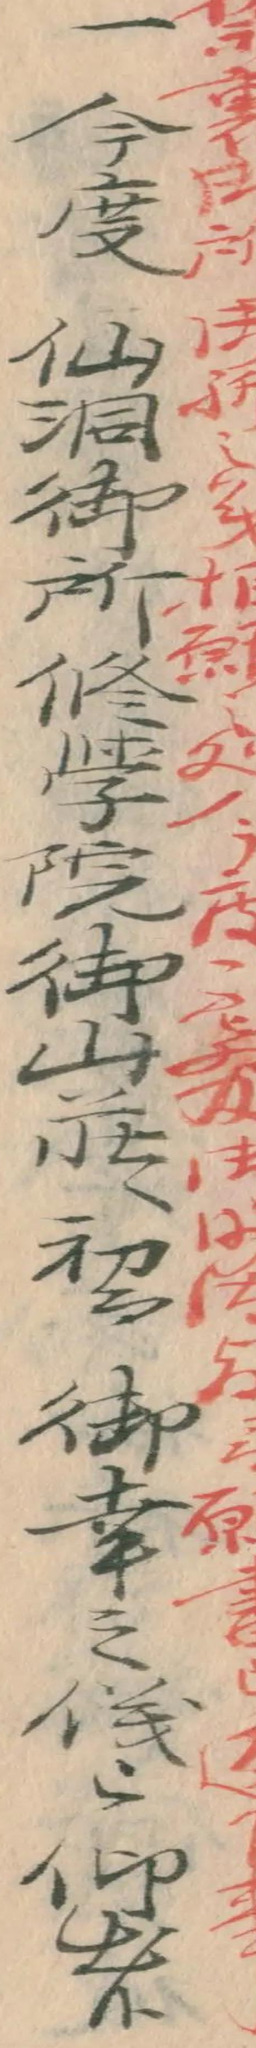一今度仙洞御所修學院御山荘へ初而御幸之儀被仰出候

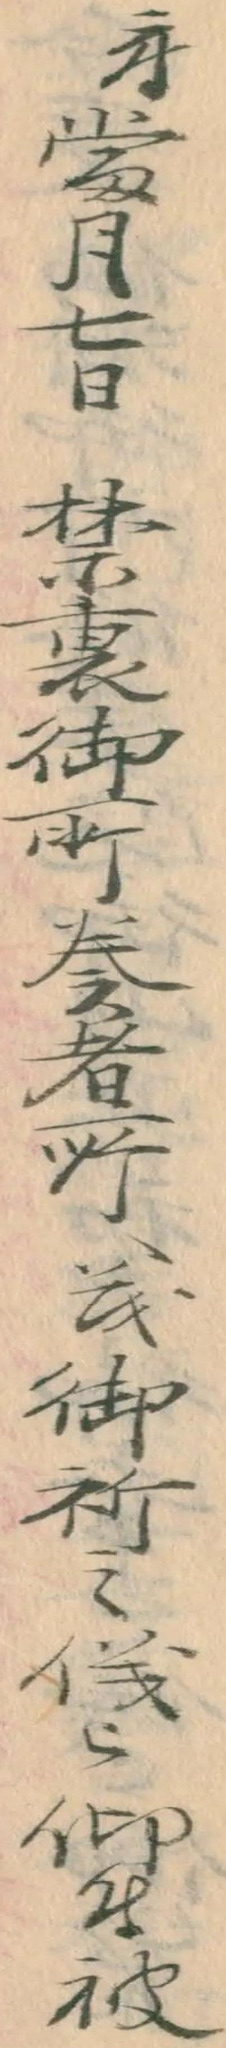ニ月當月七日禁裏御所奏者所へも御祈之儀被仰付被
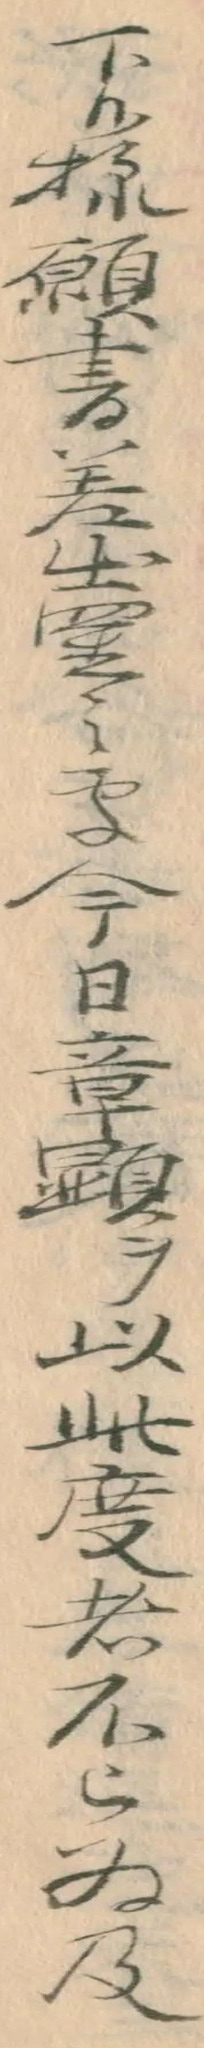下候様願書差出置之處今日章顕ヲ以此度者不被為及
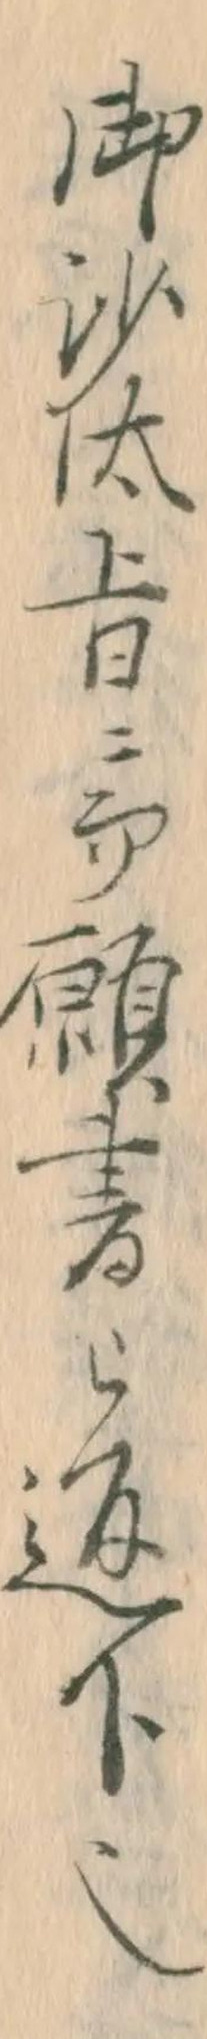御沙汰旨ニ而願書被返下也
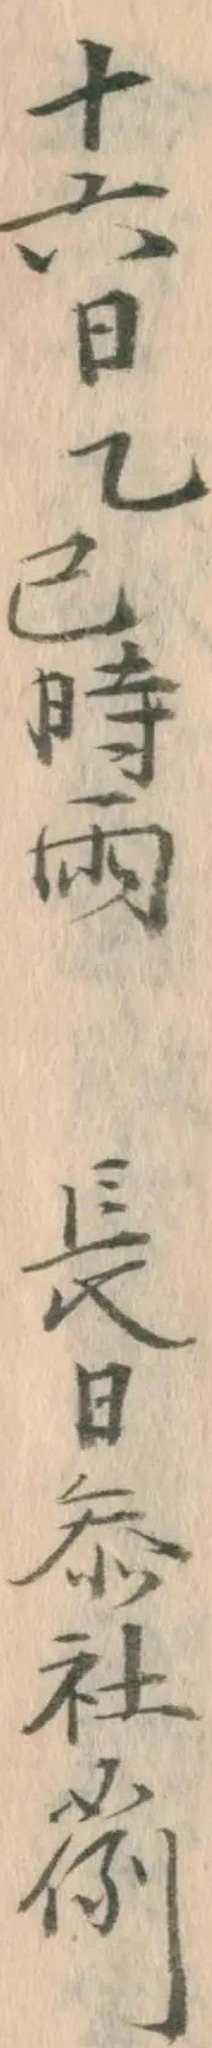十六日乙巳時雨長日参社如例
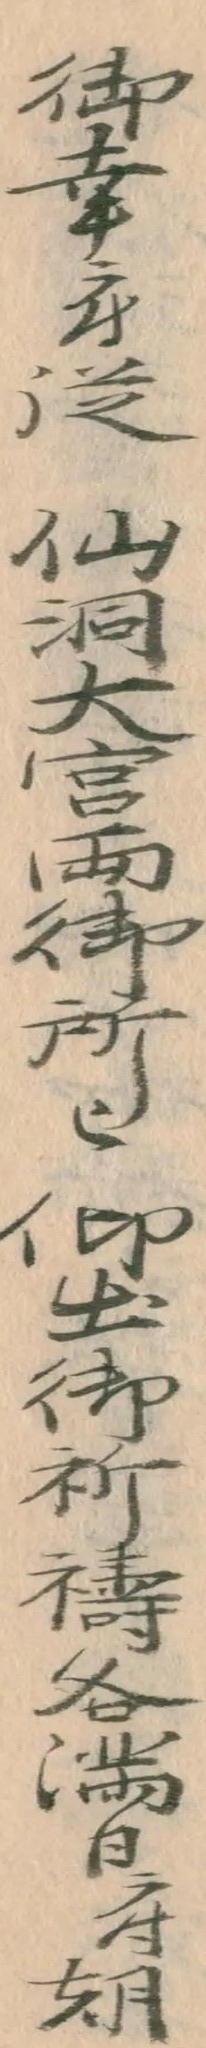一御幸ニ付従仙洞大宮両御所被仰出御祈祷各満日ニ付朝
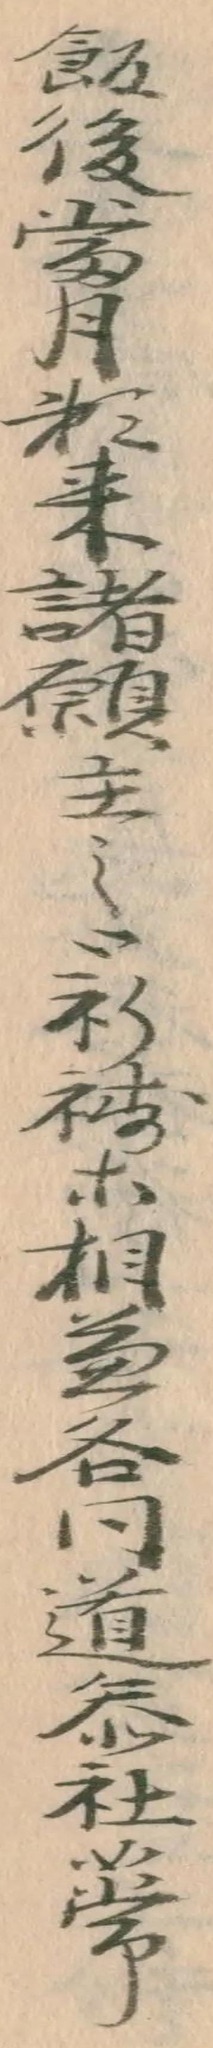飯後當月頼来諸願主之御祈祷等相兼各同道参社如常
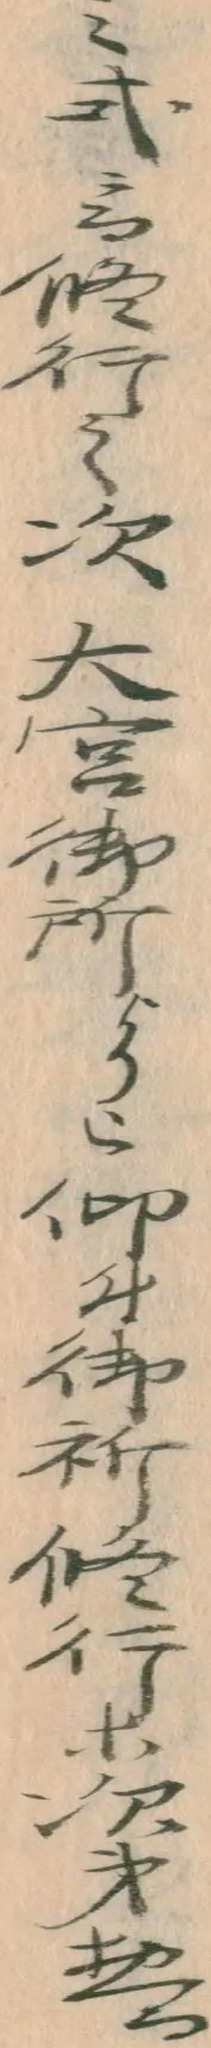之式ニ而修行之次大宮御所より被仰付御祈修行等次第惣而
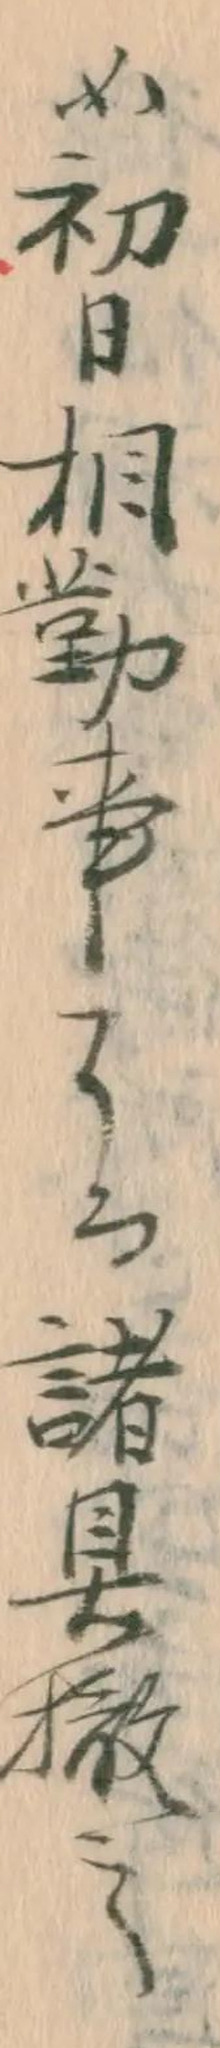如初日相勤事了而諸具撤之
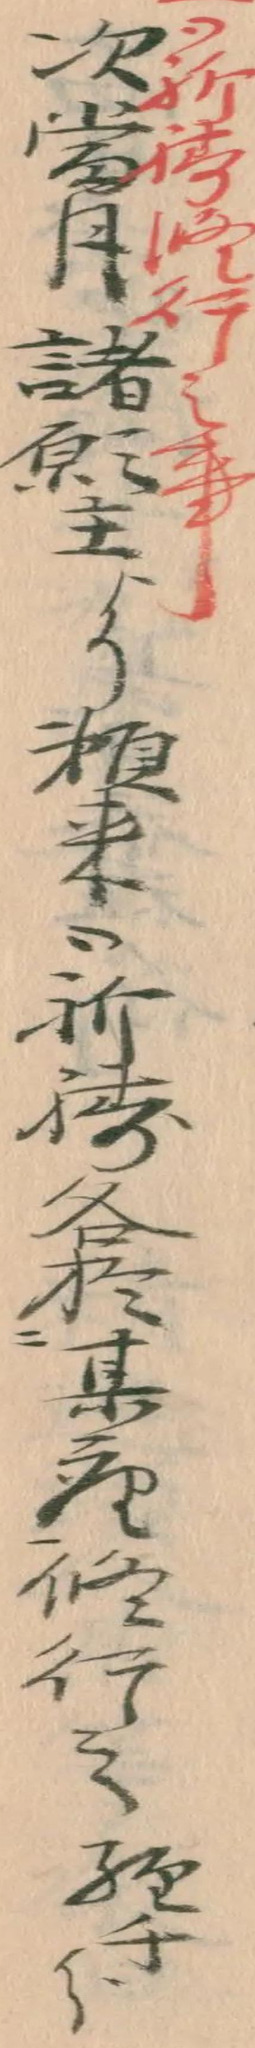次當月諸願主より頼来御祈祷各於某座修行之経千分
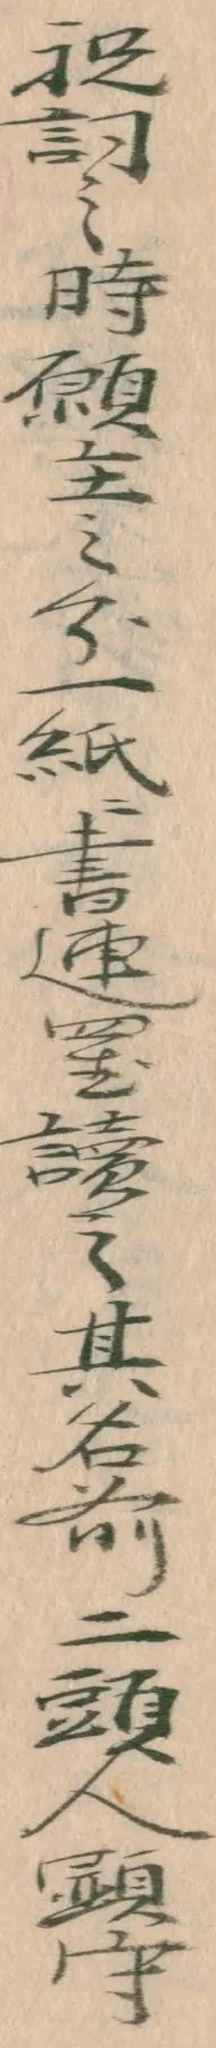祝詞之時願主之分一紙ニ書連置讀之其名前二頭人顕守
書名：賀茂社記録. 第74冊
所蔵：国立国会図書館 National Diet Library, JAPAN
